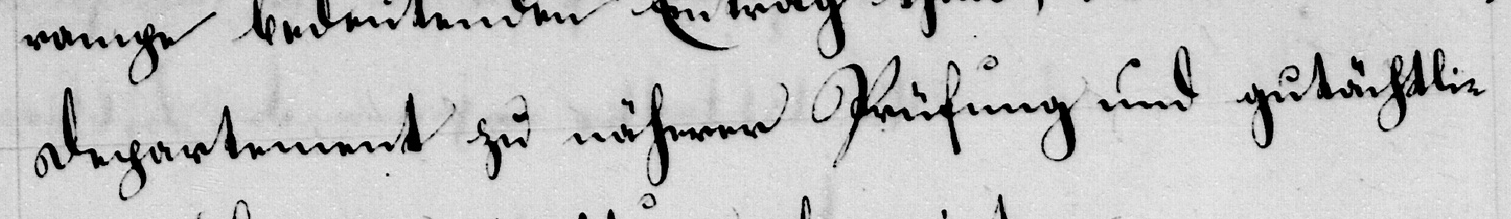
departement zu näherer Prüfung und gutächtli¬
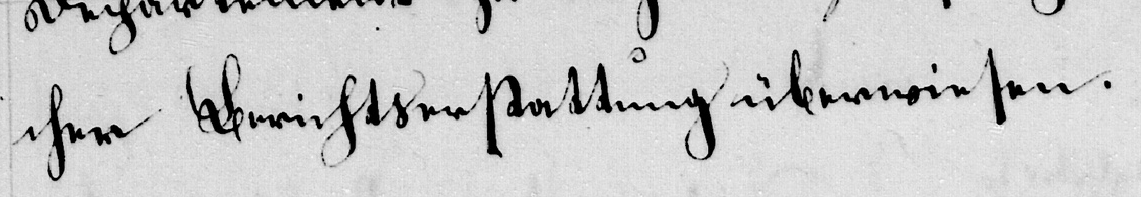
chen Berichtserstattung überwiesen.
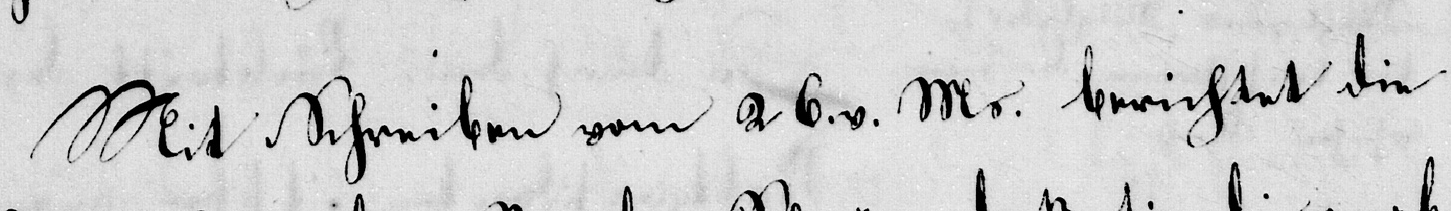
Mit Schreiben vom 26. v. Ms. berichtet die
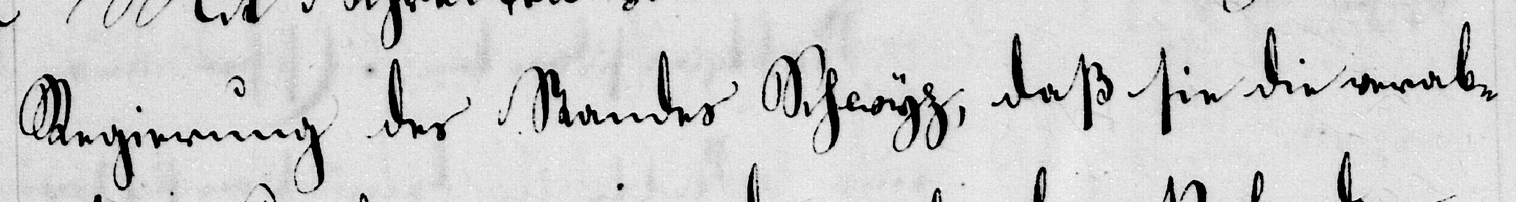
Regierung des Standes Schwyz, daß sie die verab¬
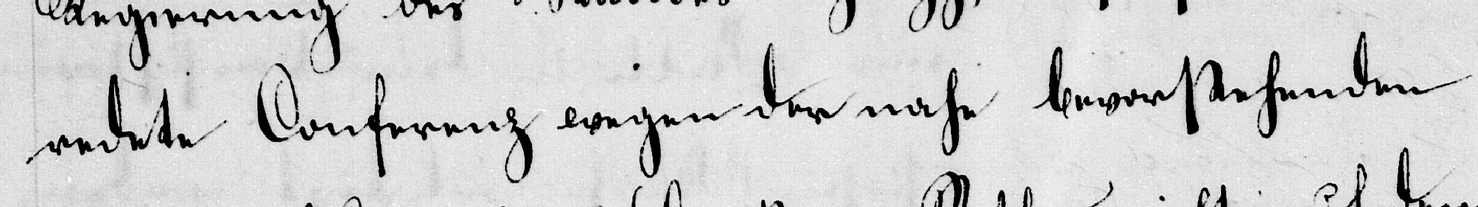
redete Conferenz wegen der nahe bevorstehenden
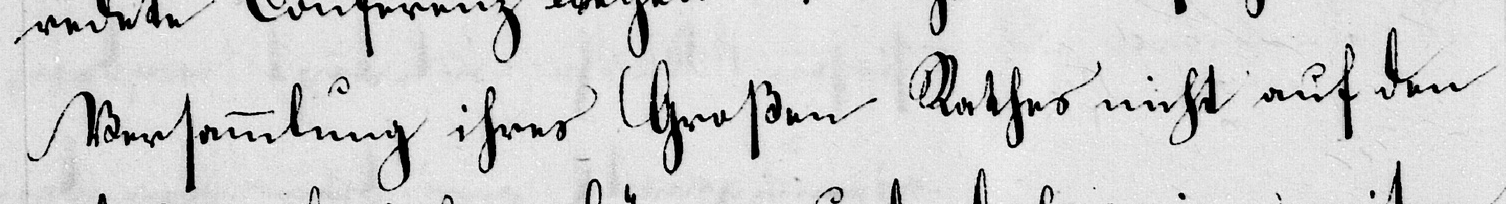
Versammlung ihres Großen Rathes nicht auf den
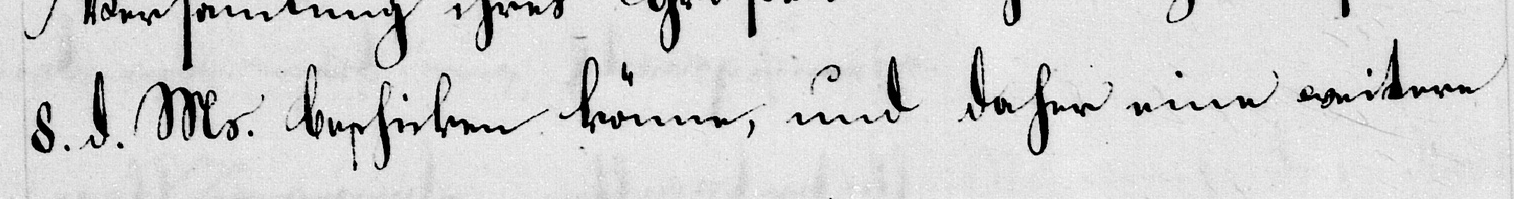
8. d. Ms. beschicken könne, und daher eine weitere
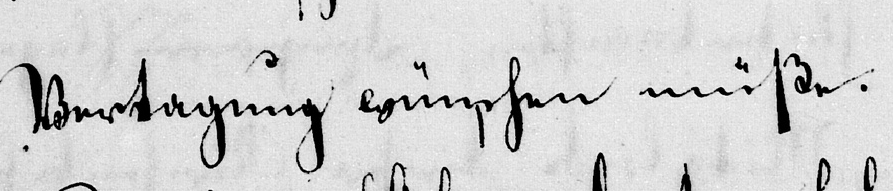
Vertagung wünschen müße.
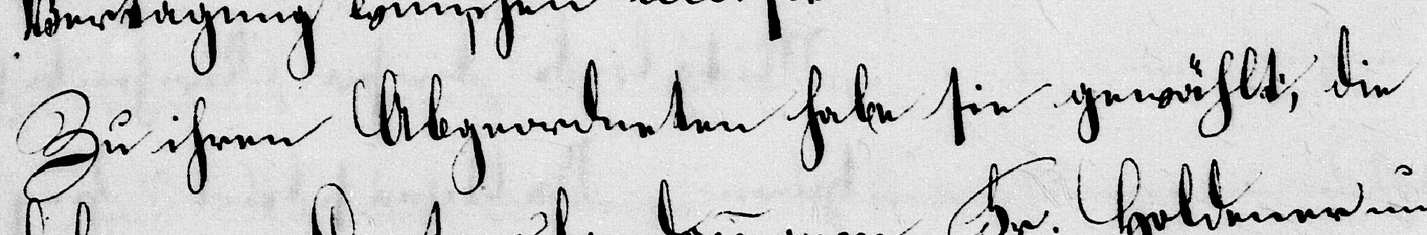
Zu Ihren Abgeordneten habe sie gewählt, die
